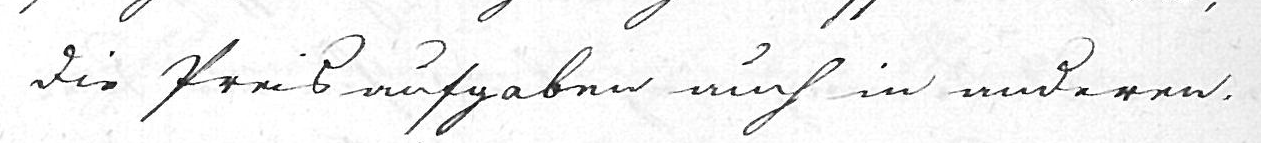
die Preisaufgaben auch in anderen,
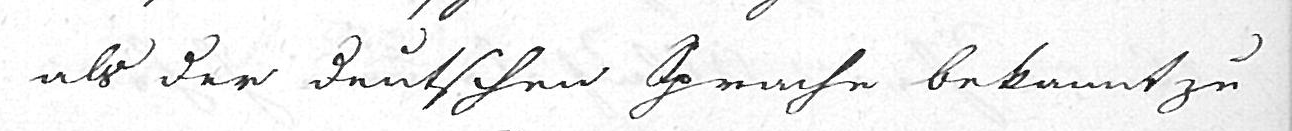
als der deutschen Sprache bekannt zu
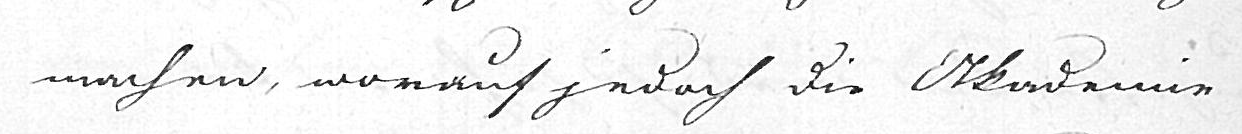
machen, worauf jedoch die Akademie
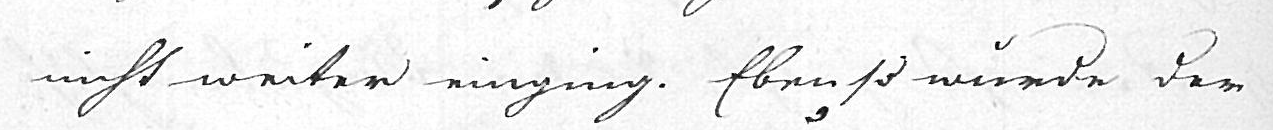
nicht weiter einging. Ebenso wurde der
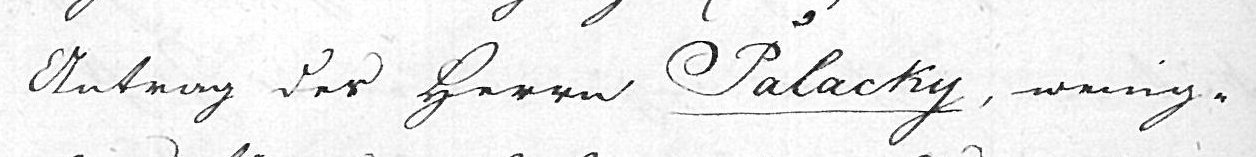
antrag des Herrn Palacky, wenig-
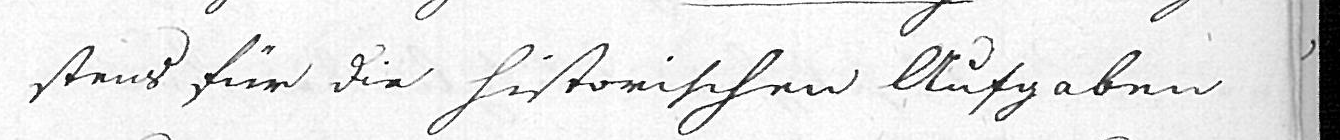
stens für die historischen Aufgaben
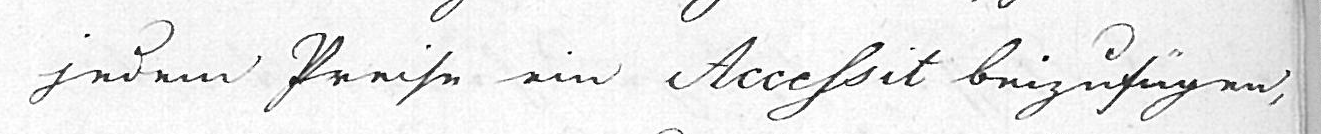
jedem Preise ein Accessit beizufügen,
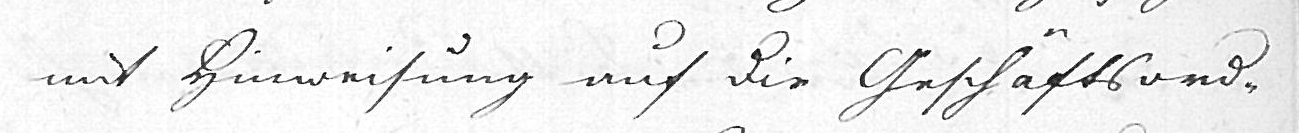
mit Hinweisung auf die Geschäftsord-
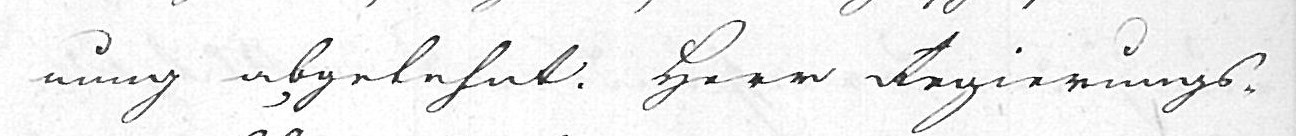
nung abgelehnt. Herr Regierungs-
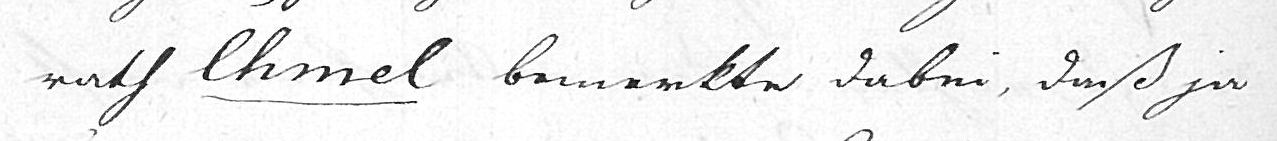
rath Chmel bemerkte dabei, daß ja
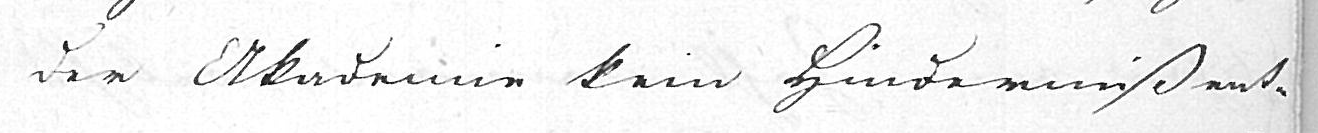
der Akademie kein Hinderniß ent-
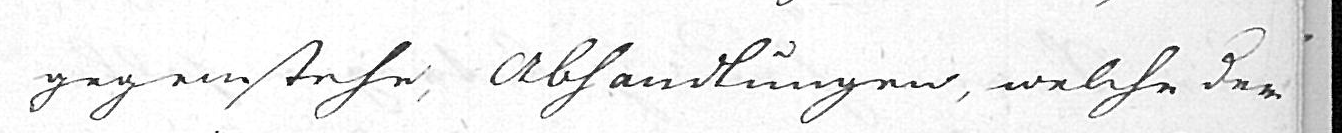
gegenstahe, Abhandlungen, welche der
